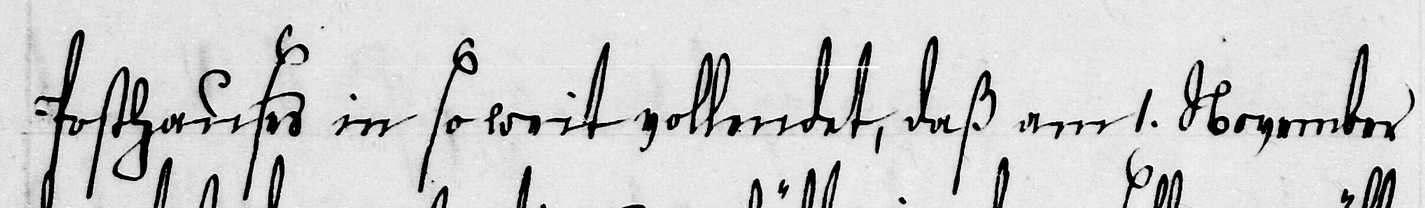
Posthauses in so weit vollendet, daß am 1. November
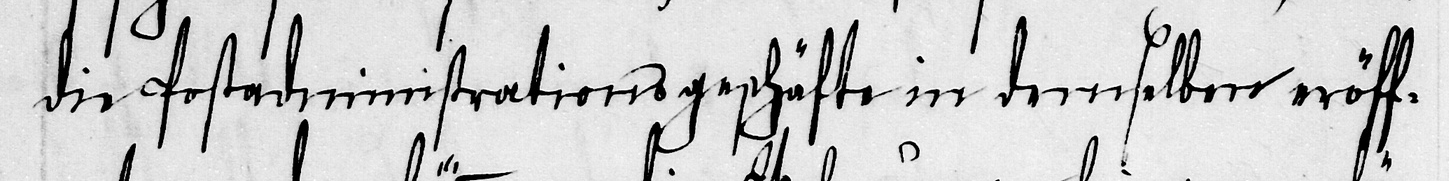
die Postadministrationsgeschäfte in demselben eröff¬
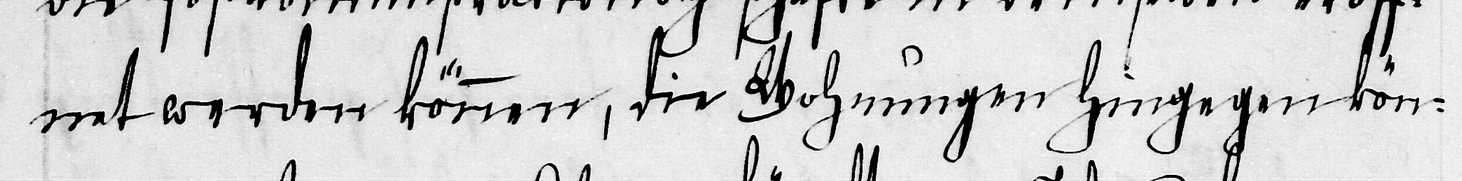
net werden können, die Wohnungen hingegen kön¬
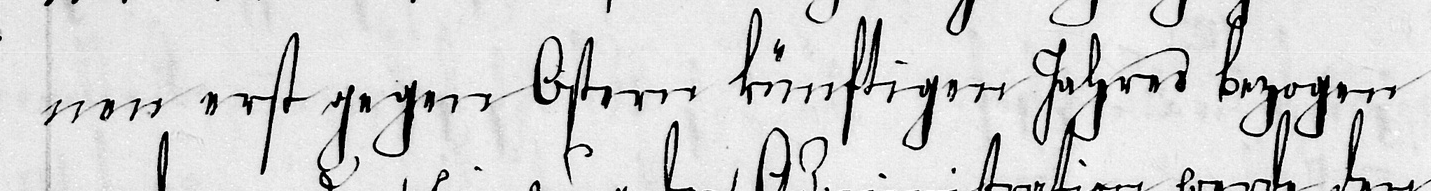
nen erst gegen Ostern künftigen Jahres bezogen
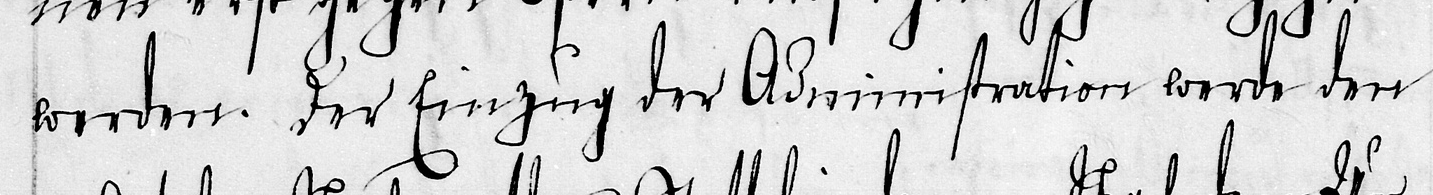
werden. Der Einzug der Administration werde den
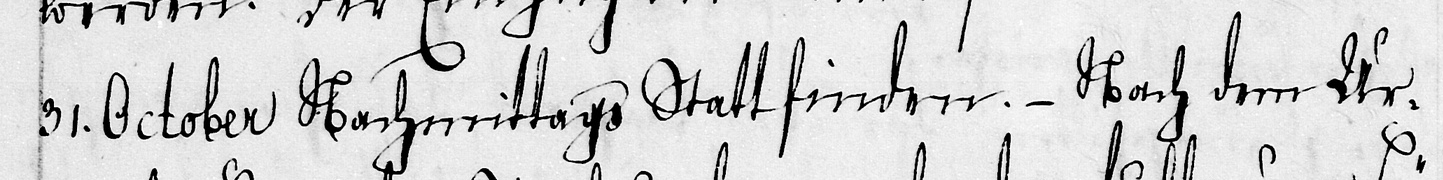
31. October Nachmittags Statt finden. – Nach dem Ur¬
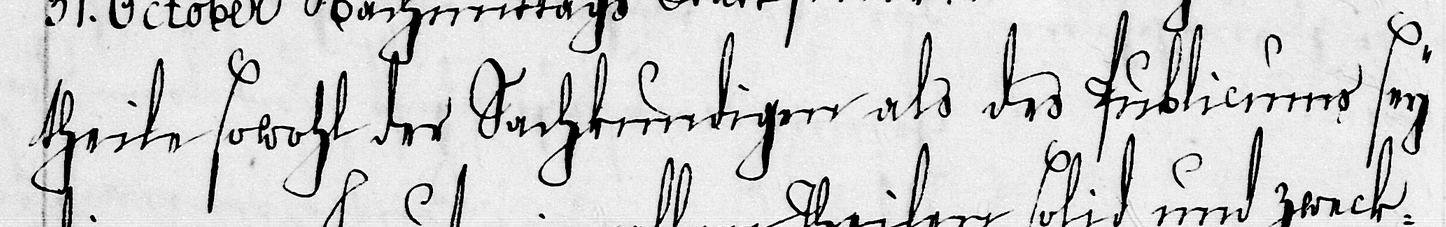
theile sowohl der Sachkundigen als des Publicums sey
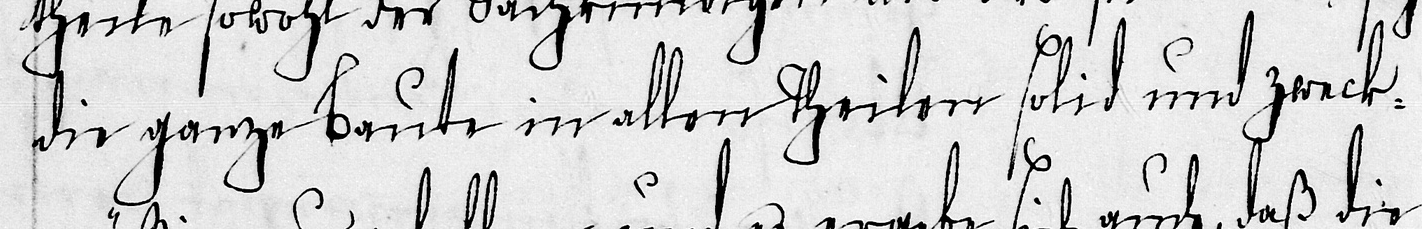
die ganze Baute in allen Theilen solid und zweck¬
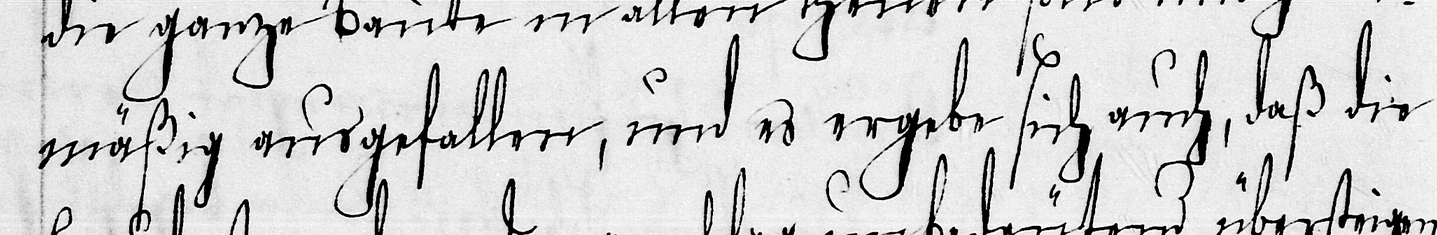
mäßig ausgefallen, und es ergebe sich auch, daß die
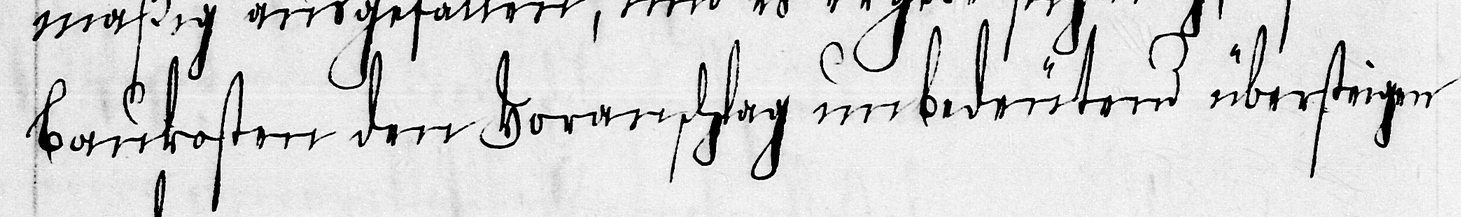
Baukosten den Voranschlag unbedeutend übersteigen
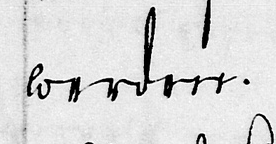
werden.
